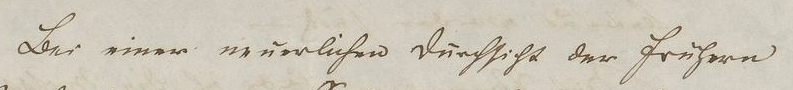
Bei einer neuerlichen Durchsicht der frühern
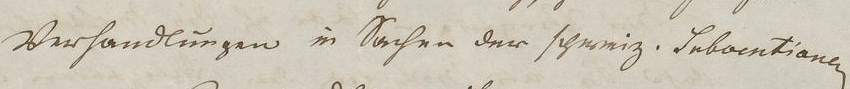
Verhandlungen in Sachen der schweiz. Subventionen
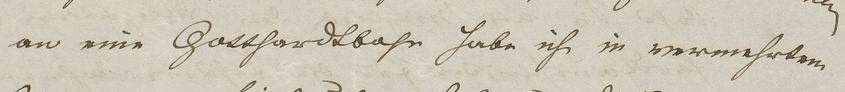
an eine Gotthardtbahn habe ich in vermehrtem
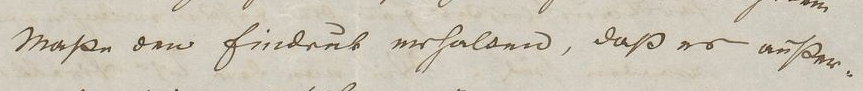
Maße den Eindruk erhalten, daß es außer-
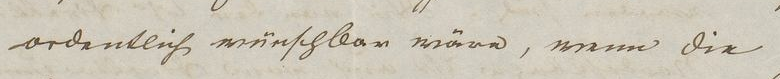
ordentlich wünschbar wäre, wenn die
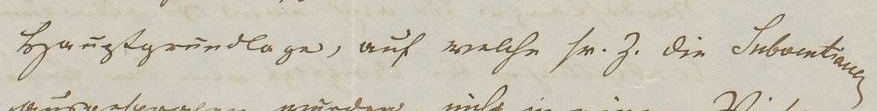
Hauptgrundlage, auf welche sr. Z. die Subventionen
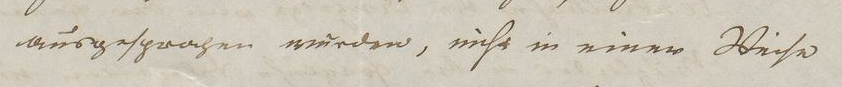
ausgesprochen wurden, nicht in einer Weise
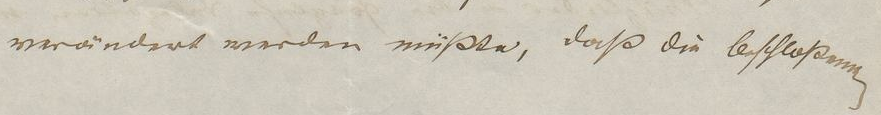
verändert werden müßte, daß die beschloßenen
